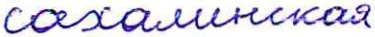сахалинская
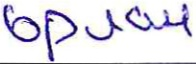орлан
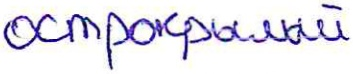острокрылый
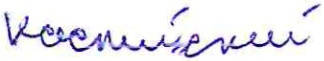каспийский
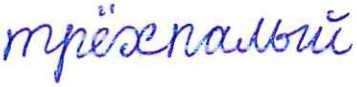трёхпалый
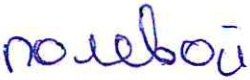полевой
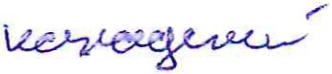канадский
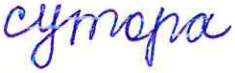сутора
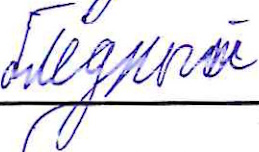бледный
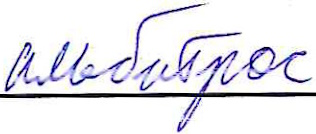альбатрос
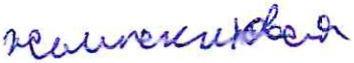желтоклювая
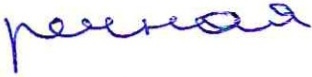речная
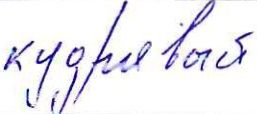кудрявый
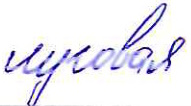луговая
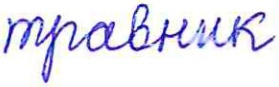травник
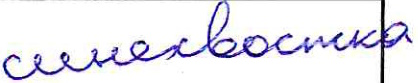синехвостка
